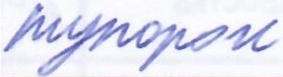тупорок
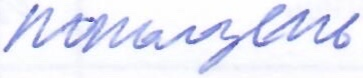попылзень
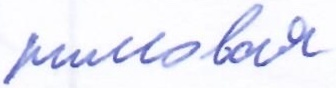тиссовая
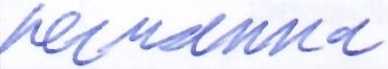песчанка
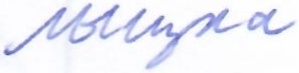лысуха
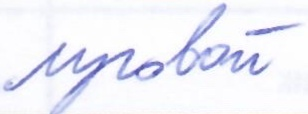луговой
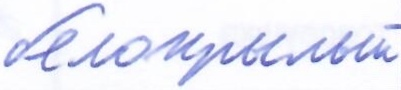белокрылый
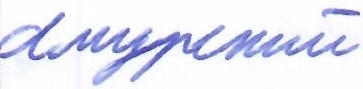амурский
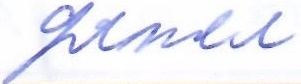дятел
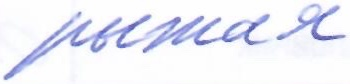рыжая
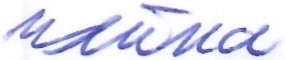чайка
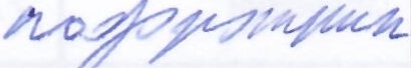подорожник
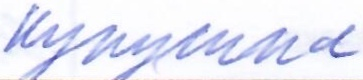кукушка
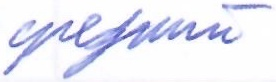средний
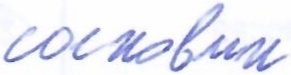сосновик
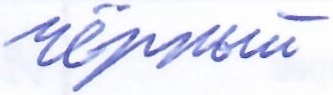чёрный
